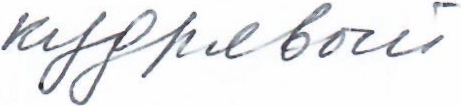кудрявый
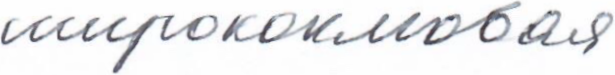ширококлювая
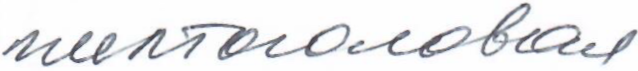желтоголовая
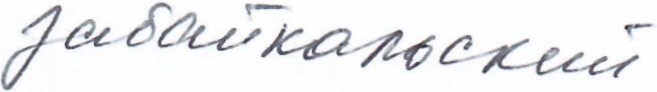забайкальский
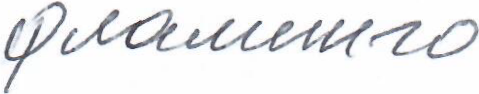фламинго
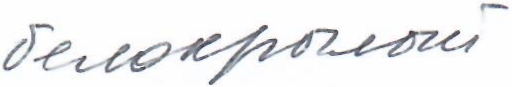белокрылый
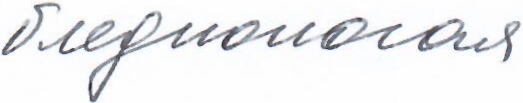бледноногая
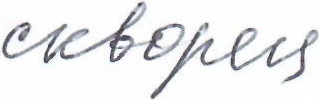скворец
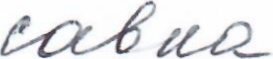савка
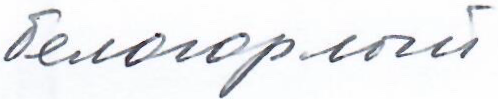белогорлый
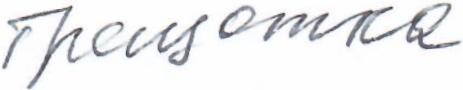трещотка
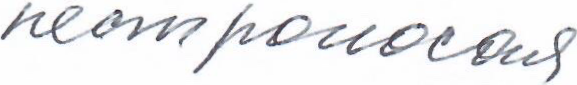пестроносая
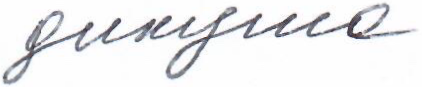дикуша
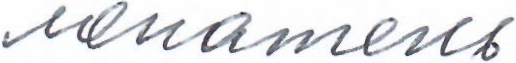лопатень
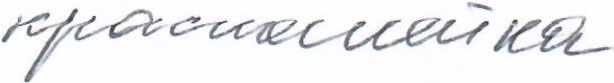красношейка
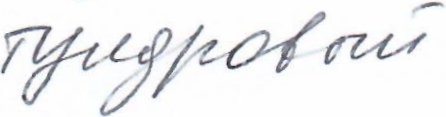тундровый
